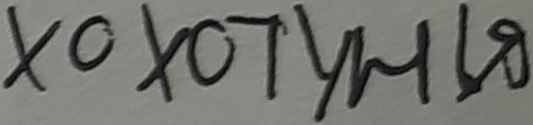хохотунья
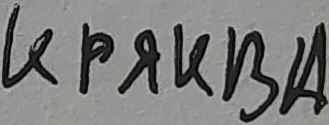кряква
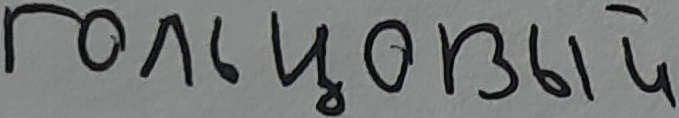гольцовый
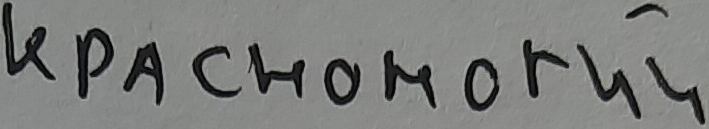красноногий
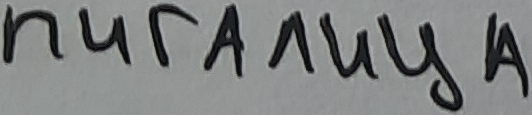пигалица
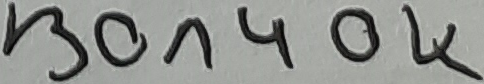волчок
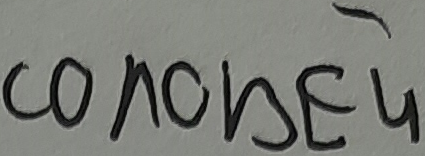соловей
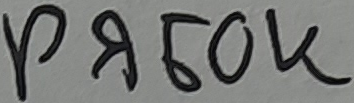рябок
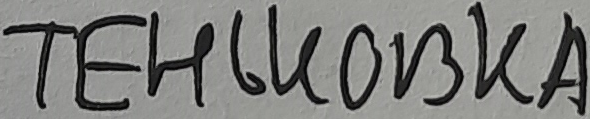теньковка
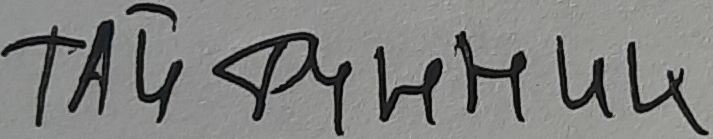тайфунник
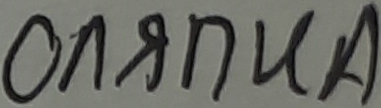оляпка
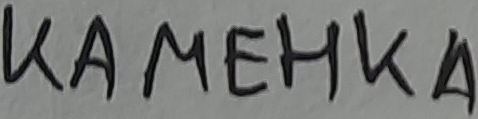каменка
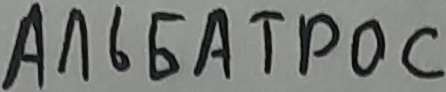альбатрос
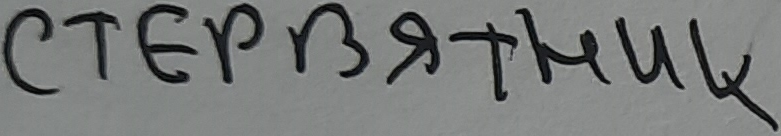стервятник
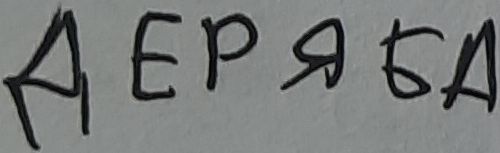деряба
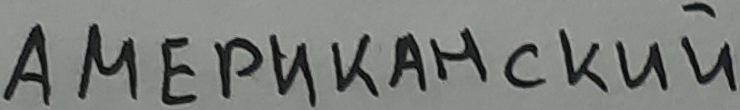американский
